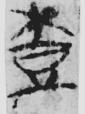梪（樹）
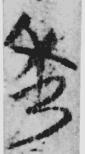秀
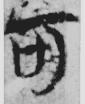可
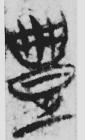豐
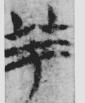芋（華）
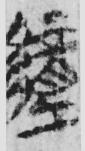○（重）
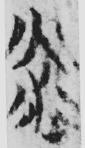光
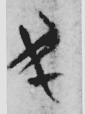民
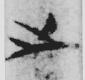之
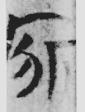所
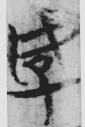好
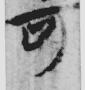可
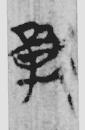○（守）
